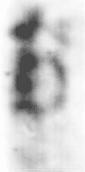坪（平）
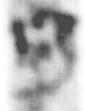夜
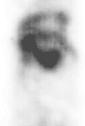君
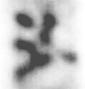之
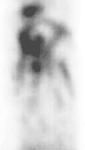兩
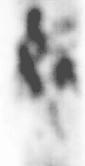駟
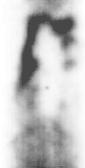○（牝）
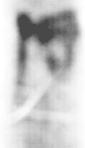石
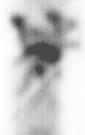芫
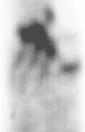桼
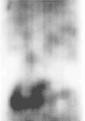㠯（以）
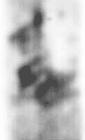𨍱（乘）
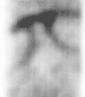亓（其）
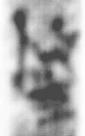○（畋）
